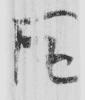厇
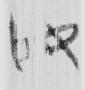母
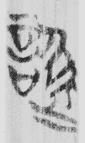{言尾止}
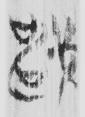{申戈}
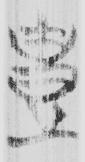豊
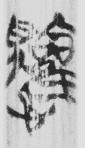{觀心}
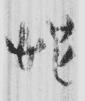怾
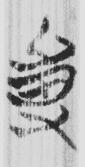尃
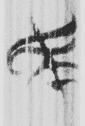民
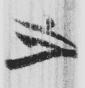之
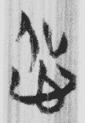{化心}
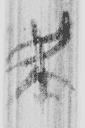民
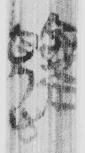{觀心}
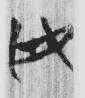母
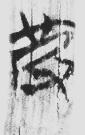皮
